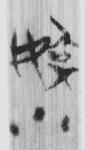{女㐬}
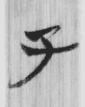子
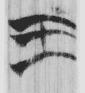王
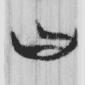曰
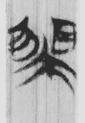{聑大}
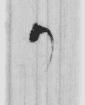人
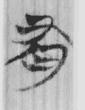有
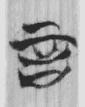言
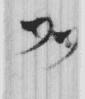多
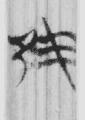隹
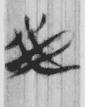我
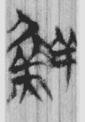鮮
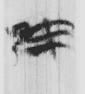隹
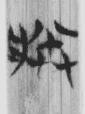朕
